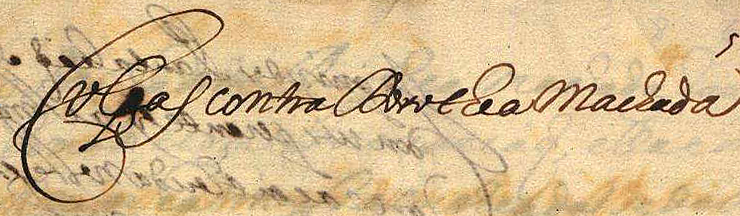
Cvlpas contra Dorothea Machada
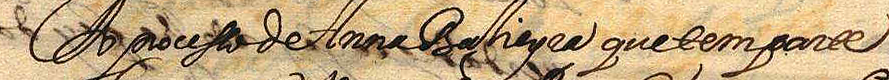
Do processo de Anna Balieyra que tem parte
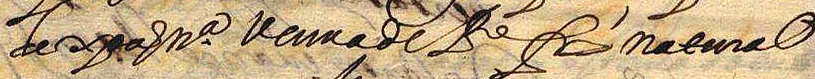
de xpā n.a Veuua de Po frz̄ natural
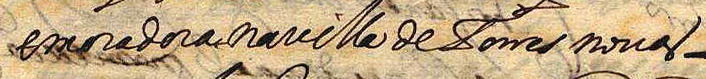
e moradora na villa de Torres nouas
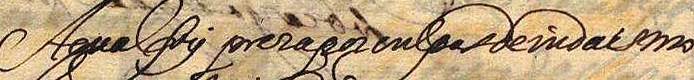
A qual foy preza por culpas de iudaismo
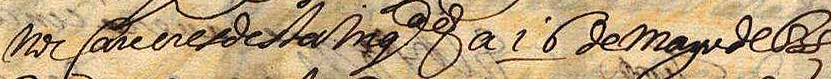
nos Carceres desta Inqcão a i6 de Mayo de 635
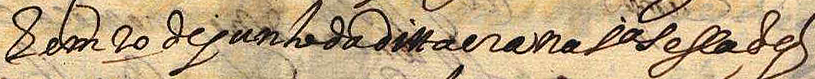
E em 20 de junho da ditta era na ia sessaõ, q̄
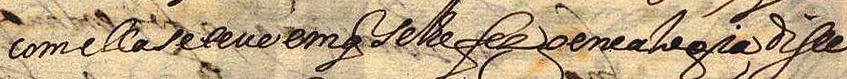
com ella se teue em q̄ se lhe fez genealogia, disse
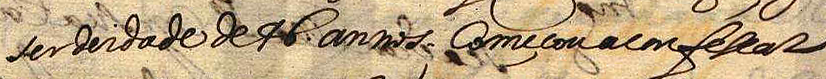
ser de idade de 46. annos. começou a confessar
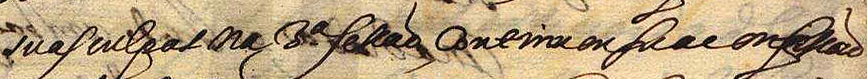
suas culpas na 3.a sessão, continuou sua confissão
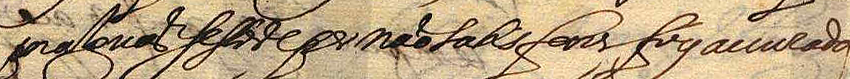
por alguas̄ sessoẽs e por naõ satisfazer, foy accuzada
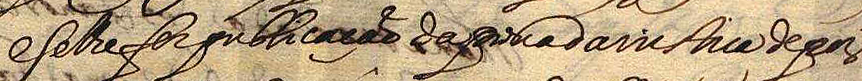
e se lhe fez publicação da proua da iustiça, depois
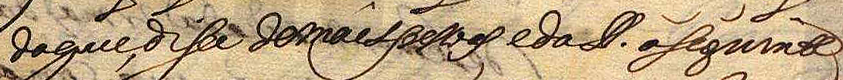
do que, disse de maês pessoas, e da R. o seguinte,
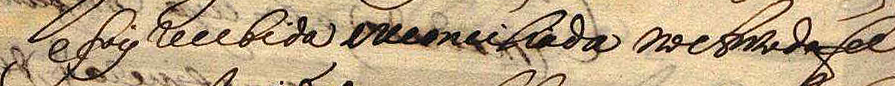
e foy recebida, e reconciliada no Auto da fee
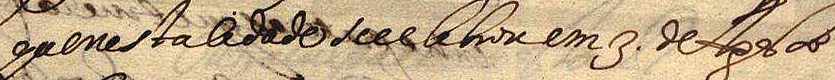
que nesta cidade se celebrou em 3. de Agosto
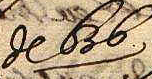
de 636
